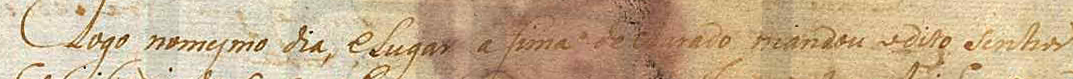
E logo no mesmo dia, e lugar asima declarado mandou o dito senhor
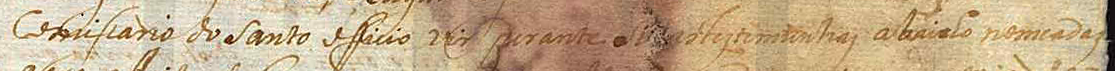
Comissario do santo officio vir perante si as testemunhas abaicho nomeadas
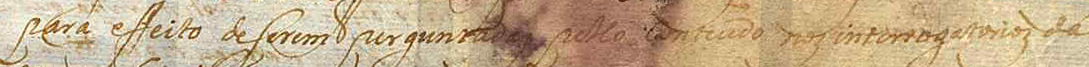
para effeito de serem perguntadas pello conteudo nos interrogatorios da
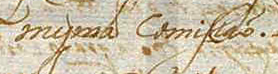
mesma Comissaõ.
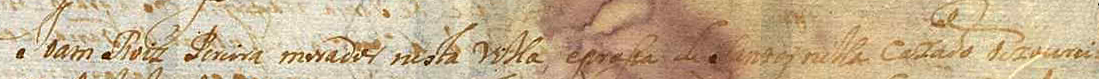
Ioam Roiz̄ Pereira morador nesta Villa, e prassa de Santos nella cazado tezourei
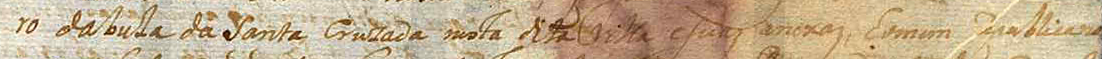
ro da bula da Santa Cruzada nesta dita Villa e suas anexas homem Republicano
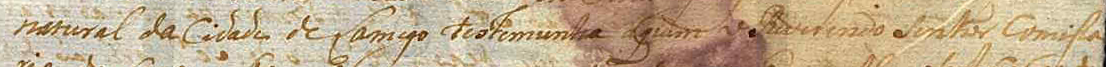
natural da Cidade de Lamego testemunha a quem o Reverendo Senhor Comissa
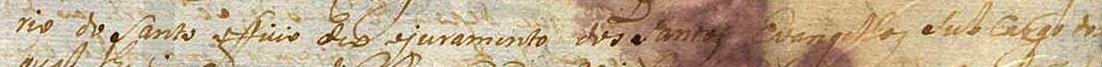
rio do Santo officio deo o juramento dos Santos Evangelhos sub Cargo do
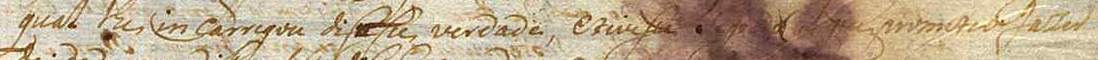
qual lhe incarregou dissesse verdade, e tivesse segredo o que prometeo fazer
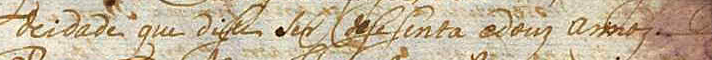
de idade que disse ser de sesenta e dous annos.
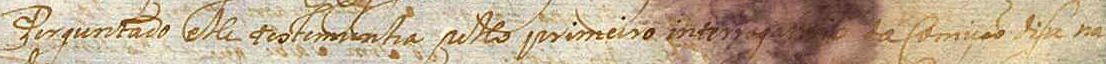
Perguntado elle testemunha pello primeiro interrogat o da Comiçaõ disse na
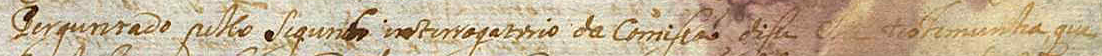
Perguntado pello Segundo interrogatorio da Comissaõ, disse el testemunha, que
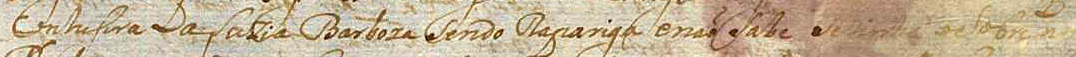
Conhesera a Luzia Barboza sendo Rapariga e naõ sabe se tinha o Sobreno
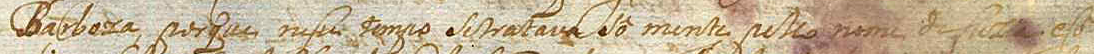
Barboza, porque nesse tempo se tratava sômente pello nome de Luzia e sô
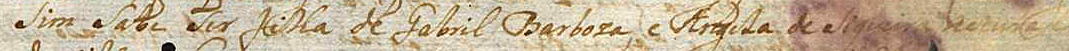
sim sabe ser filha de Gabriel Barboza, e Angela de Siqueira natural
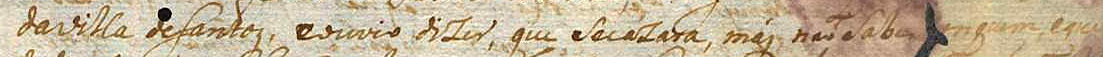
da villa de santos, e ouvio dizer, que se cazara, mas naõ Sabe on quem; e que
